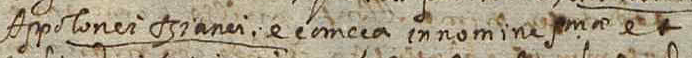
Appolonei Bianei: e começa in nomine s.mæ et
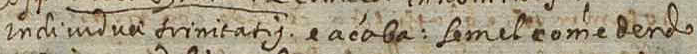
indiuiduæ trinitatis. e acaba: semel com̄edendo
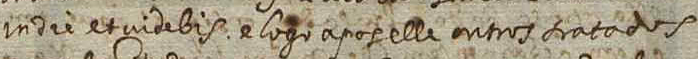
in dei et uidebis. e logo apos elle outros tratados
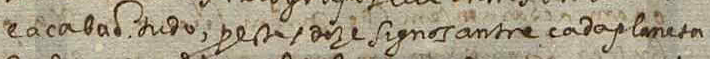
e acabaõ tudo, ꝓ estes doze signos antre cada planeta
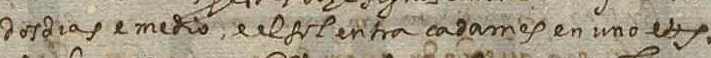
dos dias e medio, e el sol entra cada mes en uno ettꝭ.
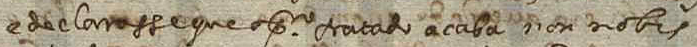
e declarasse que o p.ro tratado acaba non nobis
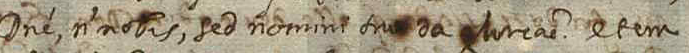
Dnē, n̄ nobis, sed nomini tuo da gloriā, e tem
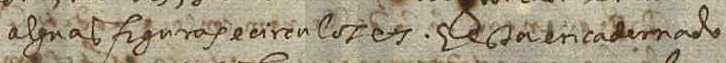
alguas̄ figuras e circulos etꝭ. E esta encadernado
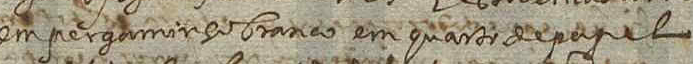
em pergaminho branco em quarto de papel
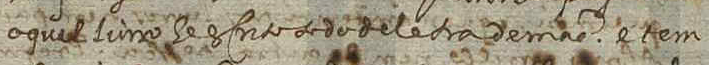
o qual liuro he esCrito todo de letra de maõ, e tem
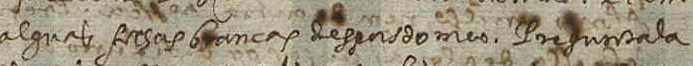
alguas̄ folhas brancas despois do meo. Preguntada
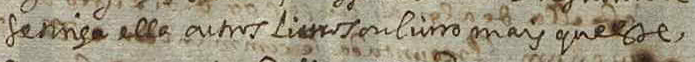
se tinha ella outros liuros ou liuro mais que este,
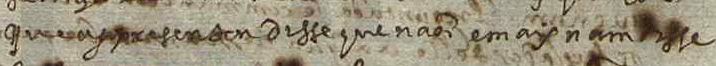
que appresentou disse que naõ e mais nam disse
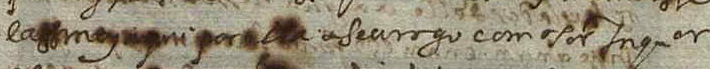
e assiney aqui por ella a seu rogo com o sor̄ Jnquor
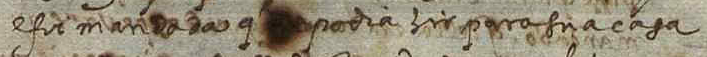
e foi mandada q̄ se podia hir pera sua casa
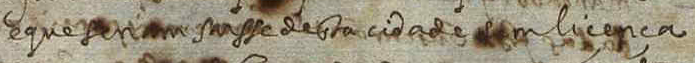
e que se nam saisse desta cidade sem licença
